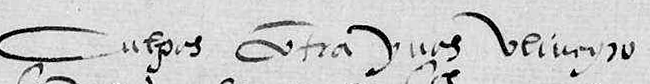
Culpas cōtra yuas vliueyro
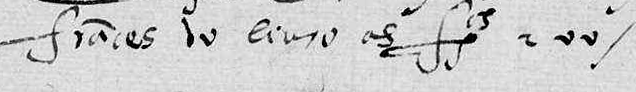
frāces do liuro as fsas 200/
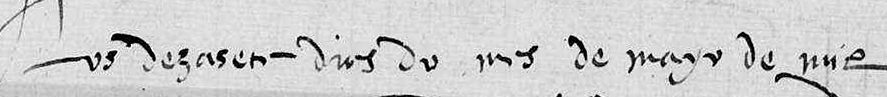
Aos dezasete dias do mes de mayo de mil
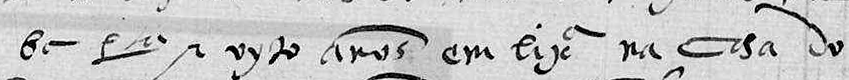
bc Lta e oyto an̄os em lixa na Casa do
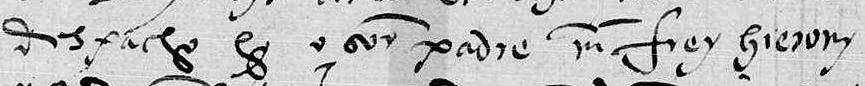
despacho hy o sōr padre me frey hierony
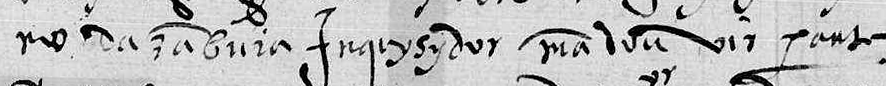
mo dazābuia Jnquysydor m̄adou vir ꝑante
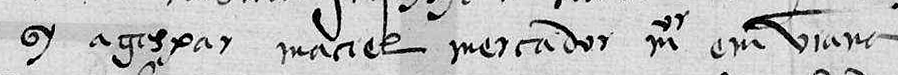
sy a gaspar maciel mercador mor em viana
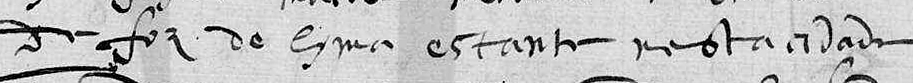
da foz de lyma estante nesta cidade
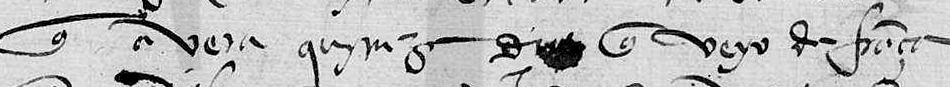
q̄ avera quymze dias q̄ veyo de frāça
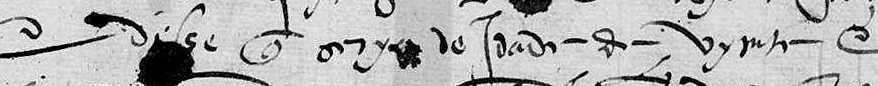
e disse q̄ serya de Jdade de vymte e
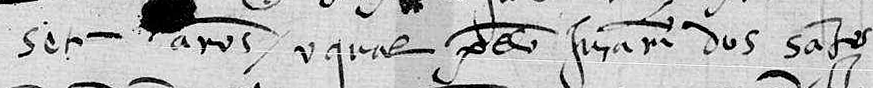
sete an̄os o qual p̄llo Juramto dos sātos
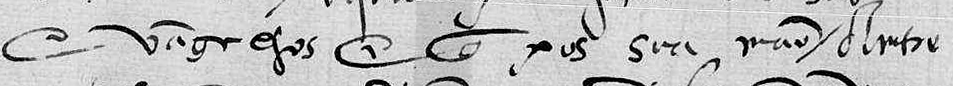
evāgelhos ē q̄ pos sua mão / Amtre
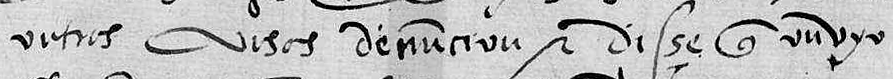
outras coisas denūciou e disse q̅ ouvyo
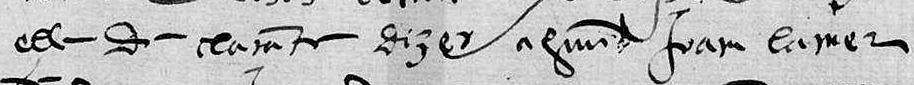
elle declarāte dizer a hu̅u Joam lamer
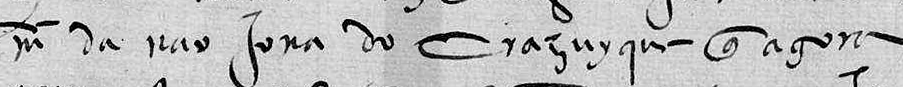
mte da nao Jona do Crazuyque q̄ agora
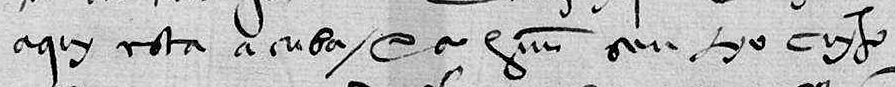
aquy esta a cuba / e a hu̅u seu tyo cuyJo
